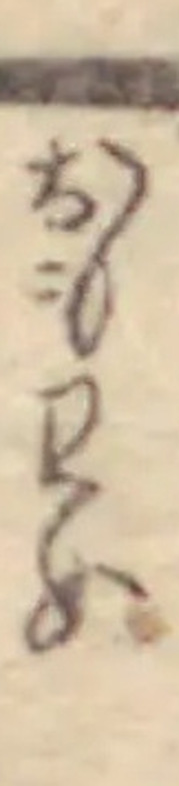おもわぬ
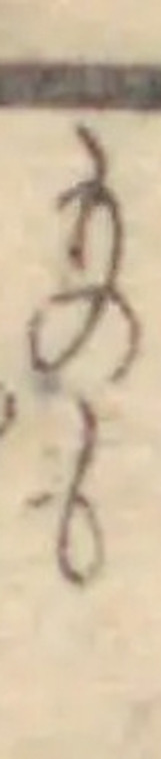ものも
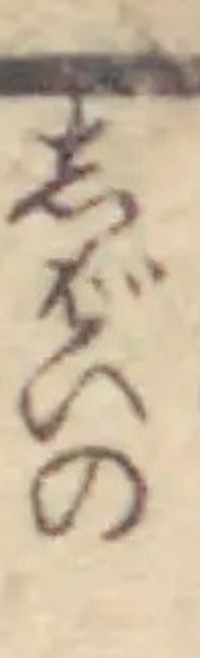しばいの
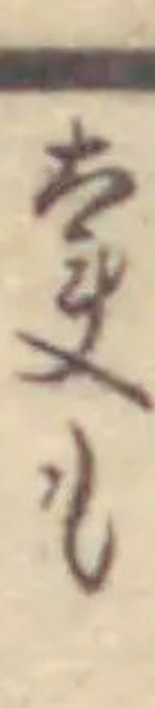太夫も
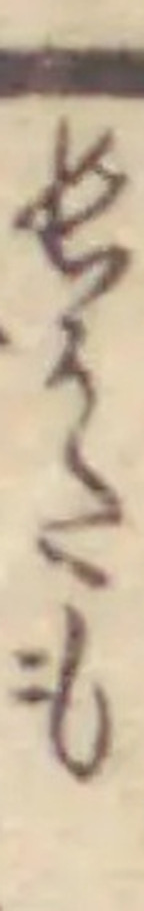長うたも
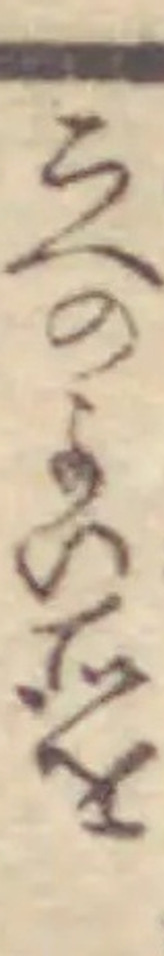こへのよい所を
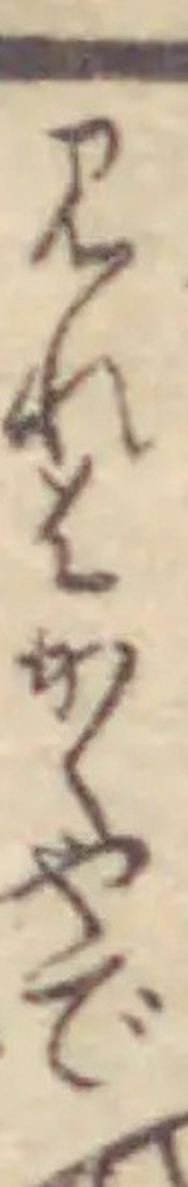見れはかくやで
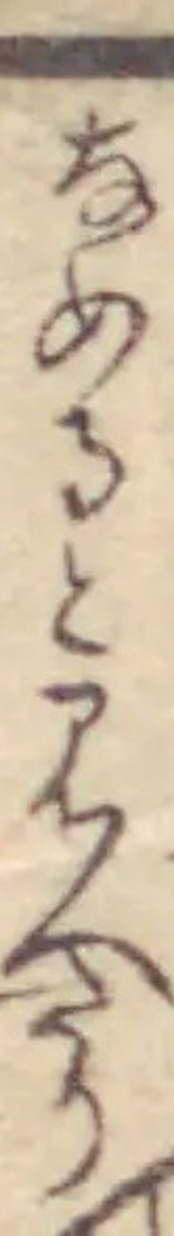なめると見へたり
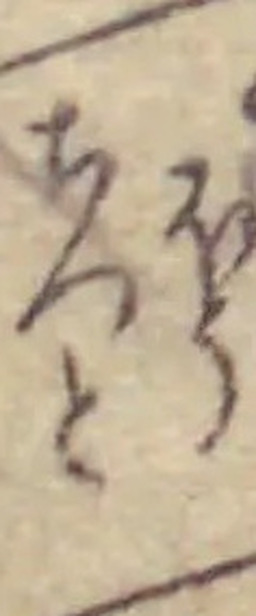ちつと
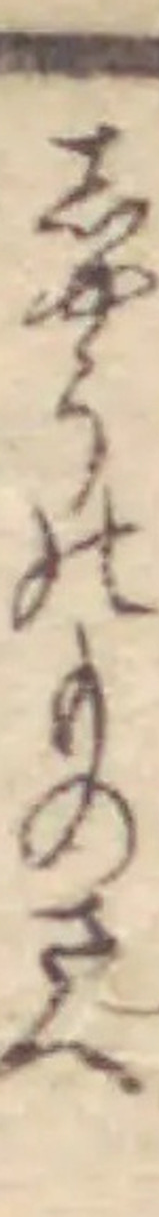しやうのものさへ
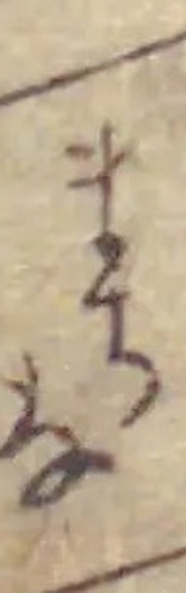まちな
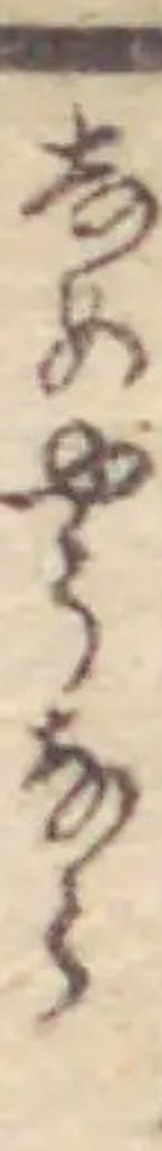なめやうなら
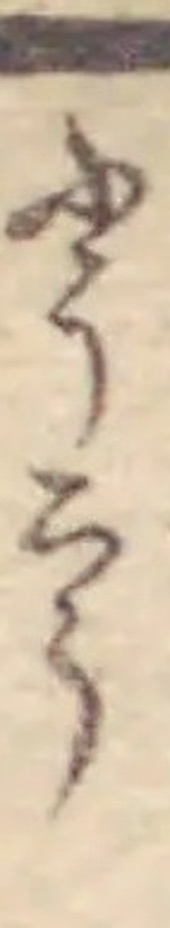ふうこう
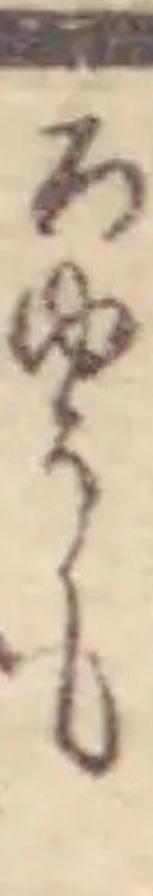ろゆうも
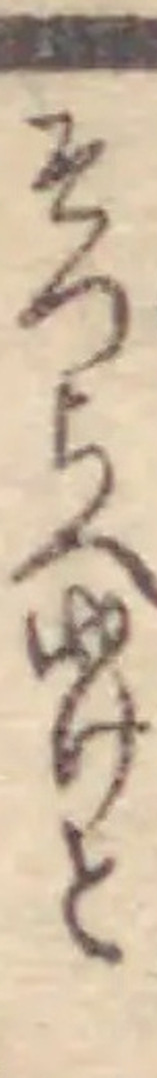そつちへゆけと
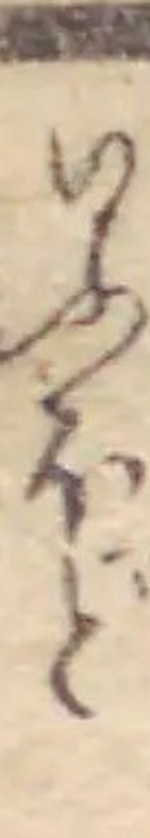いふほど
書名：家伝寿命薬 2巻
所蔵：国立国会図書館 National Diet Library, JAPAN
